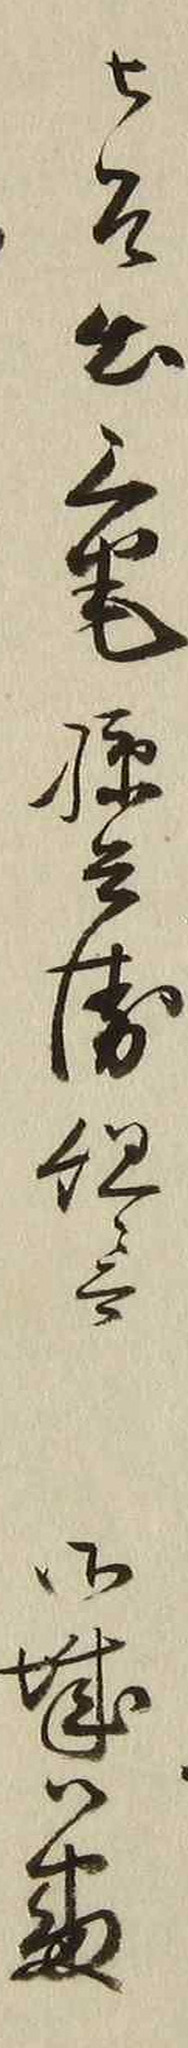被召出三宅孫兵衛組ニ而御城御番
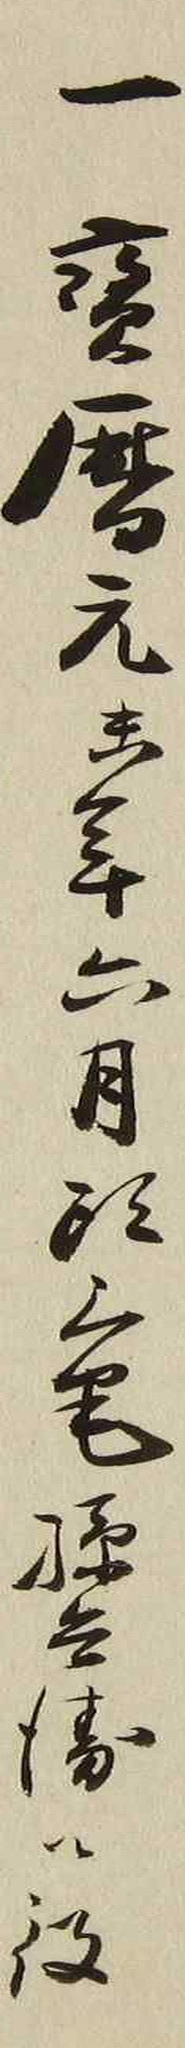一宝暦元未年六月頭三宅孫兵衛御役
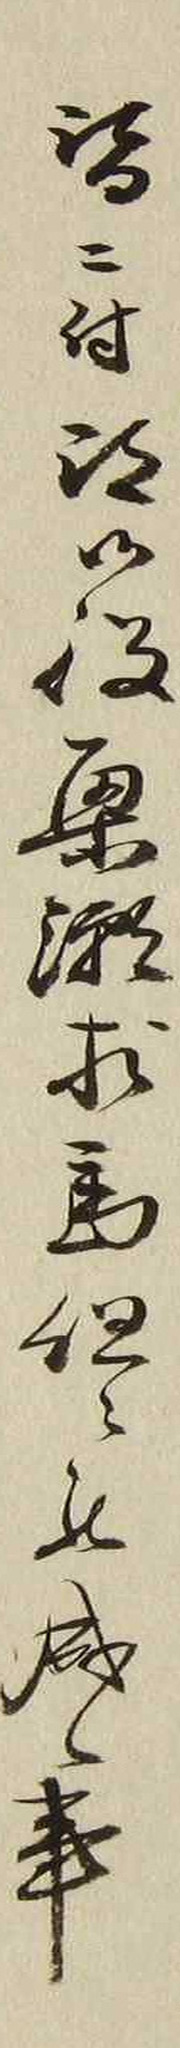替ニ付跡御役簗瀬求馬組ニ罷成候事
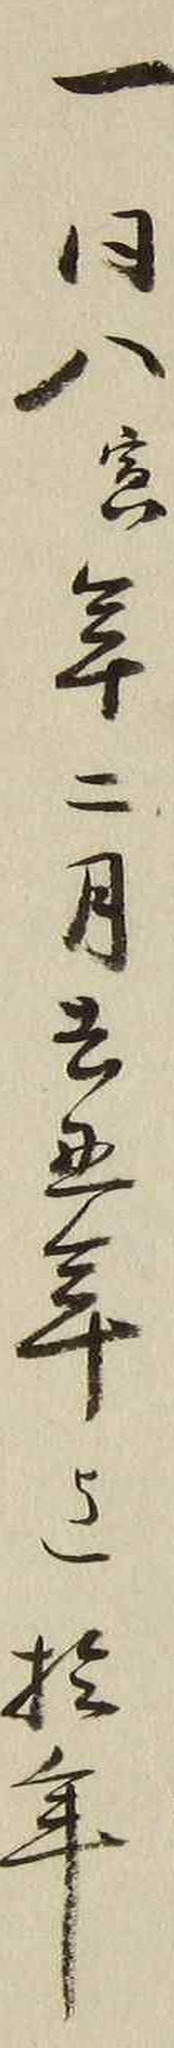一同八寅年二月去丑年迄拾年
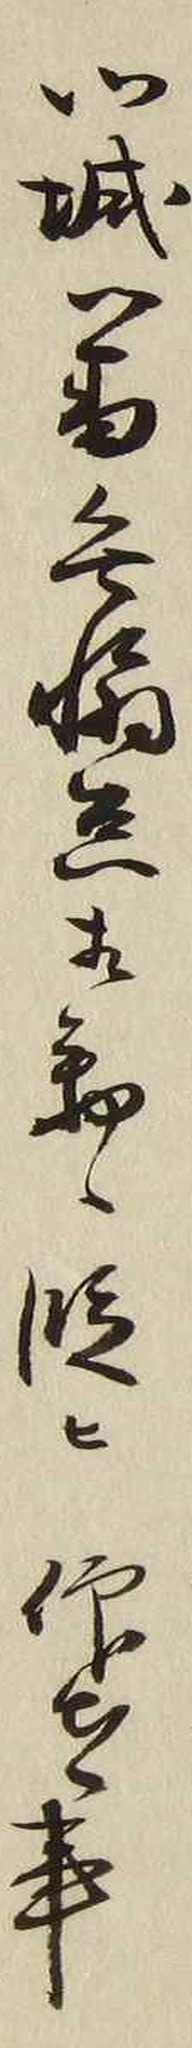御城御番無懈怠相勤候段被仰出候事
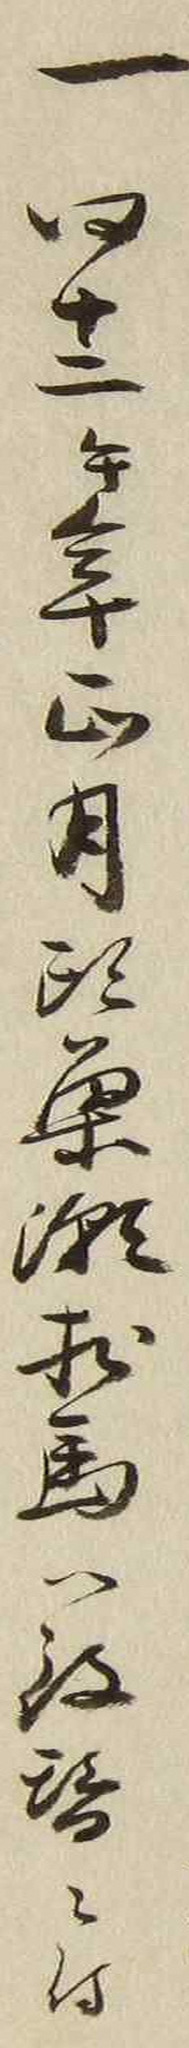一同十二午年正月頭簗瀬求馬御役替ニ付
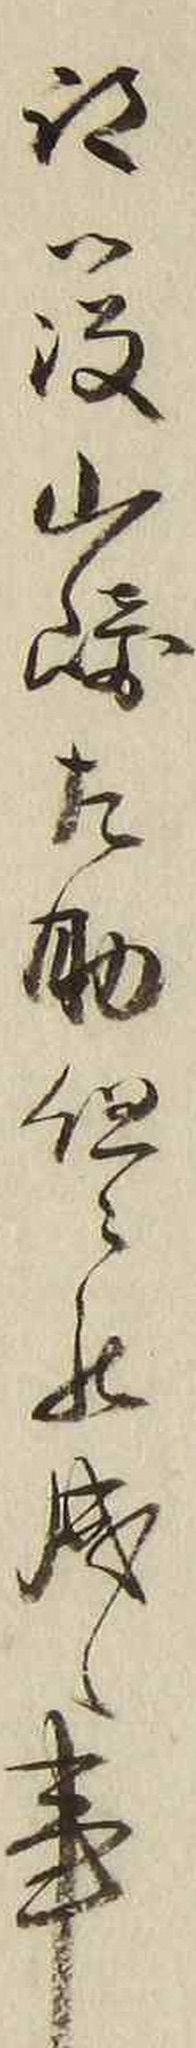跡御役山崎左助組ニ罷成候事

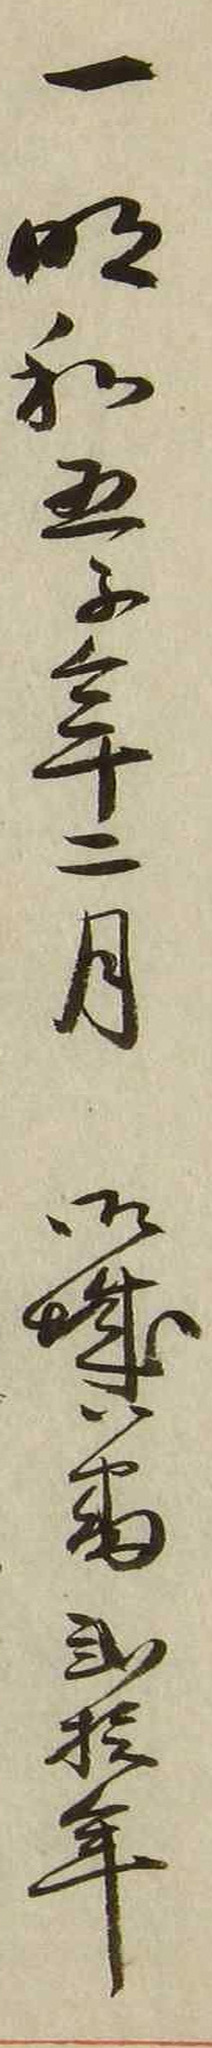一明和五子年二月御城御番弐拾年
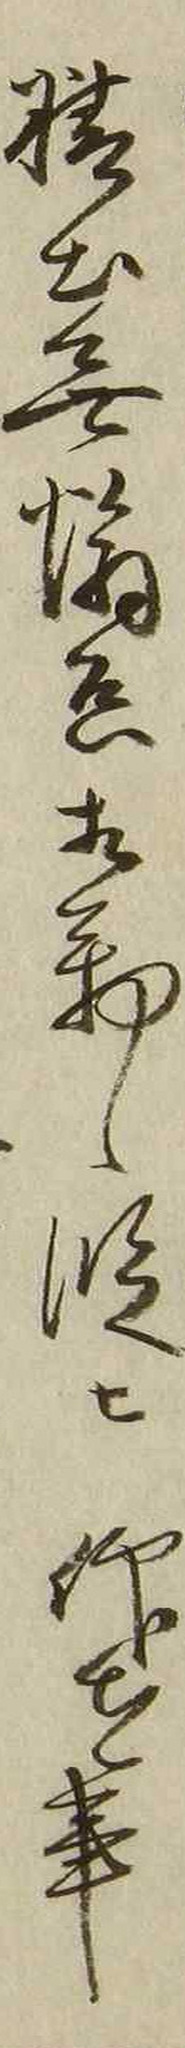精出無懈怠相勤候段被仰出候事
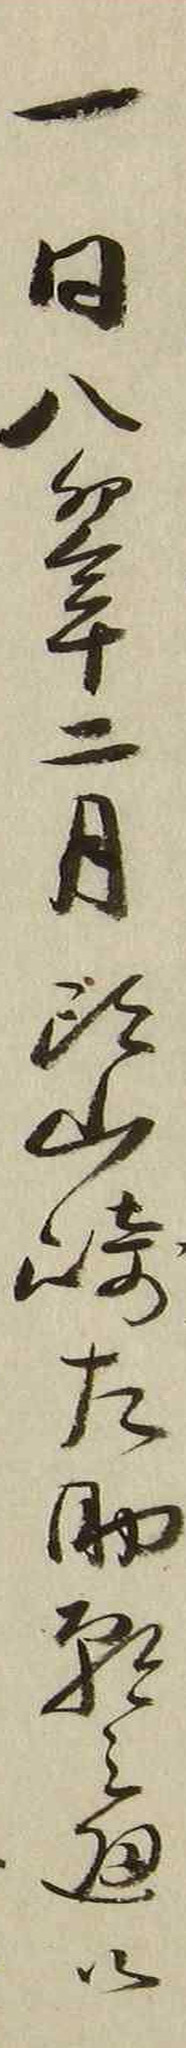一同八卯年二月頭山崎左助願之通御
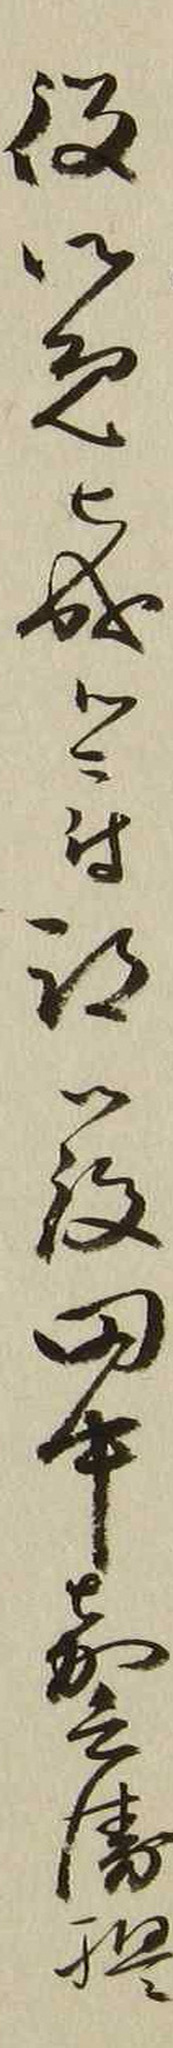役御免被成候ニ付跡御役田中嘉兵衛組ニ
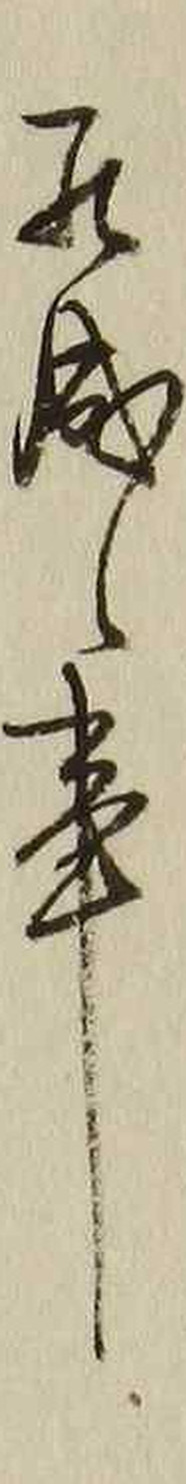罷成候事
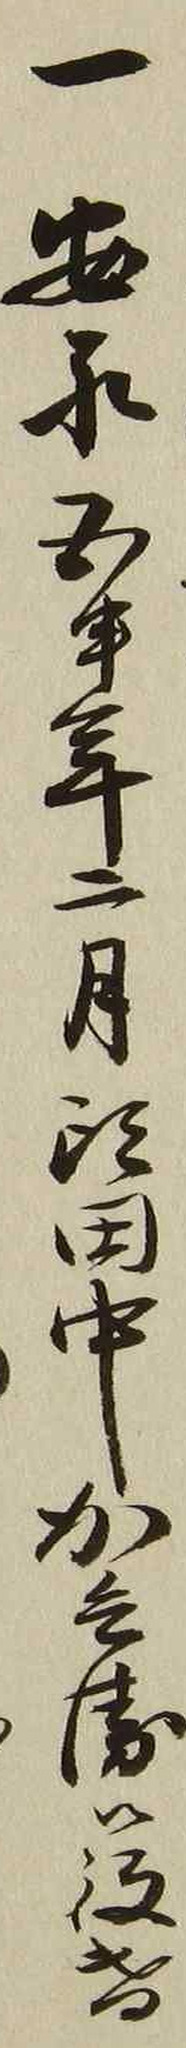一安永五申年二月頭田中加兵衛御役替
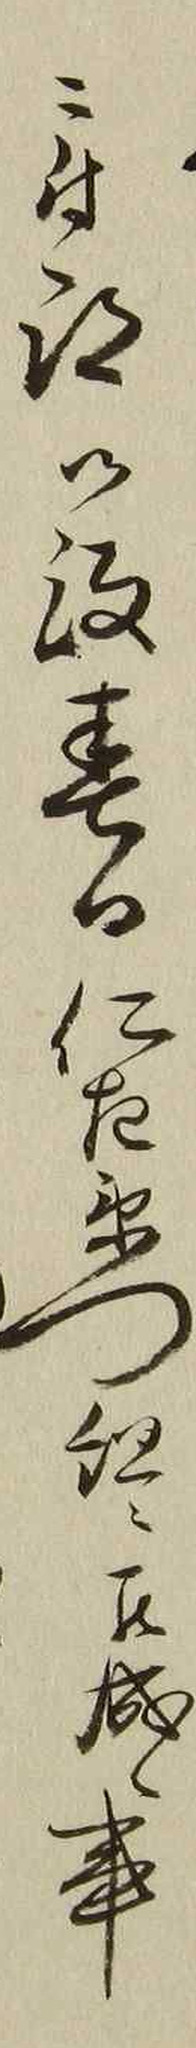ニ付跡御役春日仁左衛門組ニ罷成候事
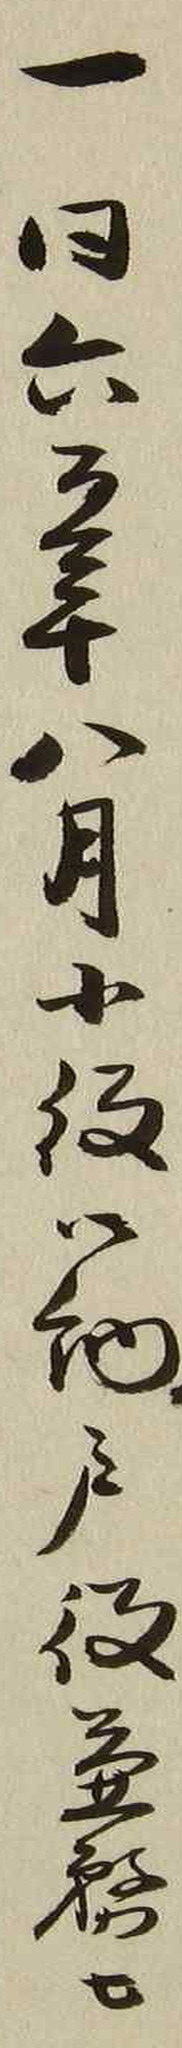一同六酉年八月小役御納戸役兼務被
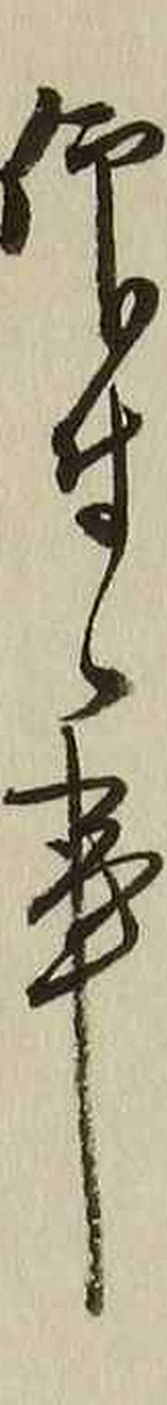仰付候事
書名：諸士系譜　巻之288　さ之部20
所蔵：会津若松市立会津図書館
